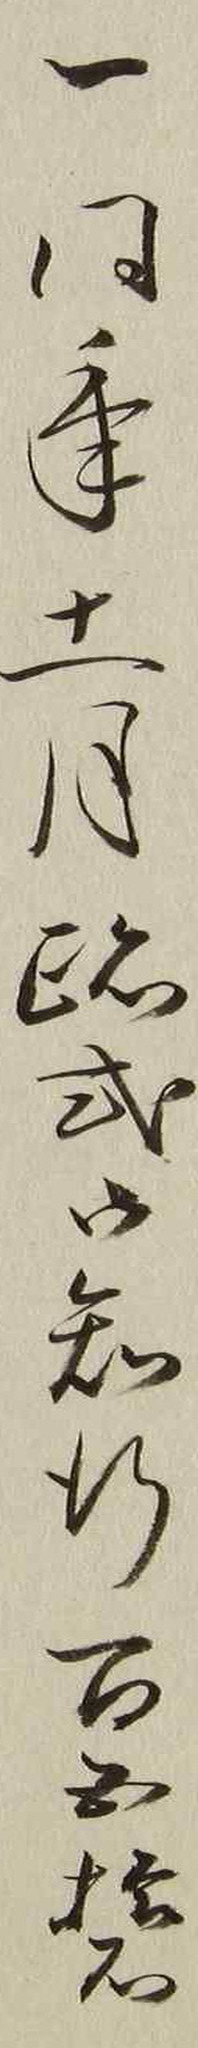一同年十一月跡式御知行百五拾石
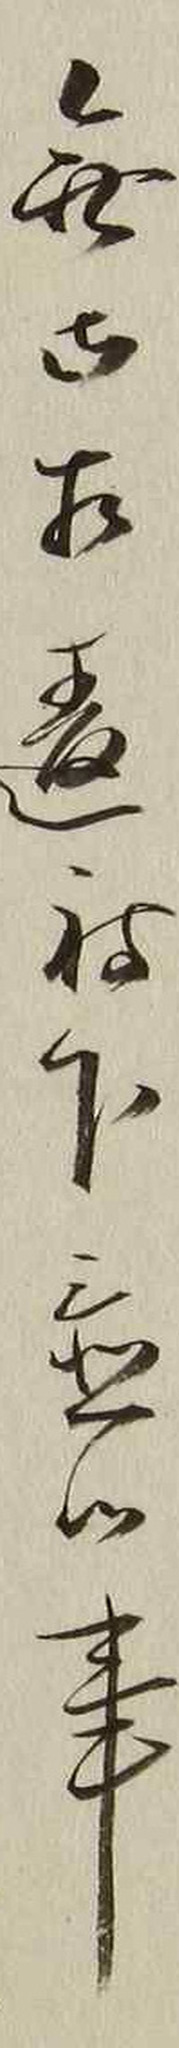無御相違被下置候事
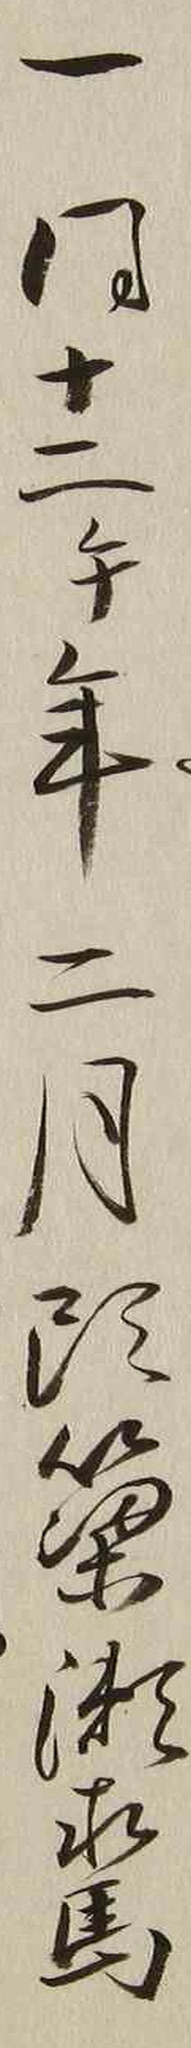一同十二午年二月頭簗瀬求馬
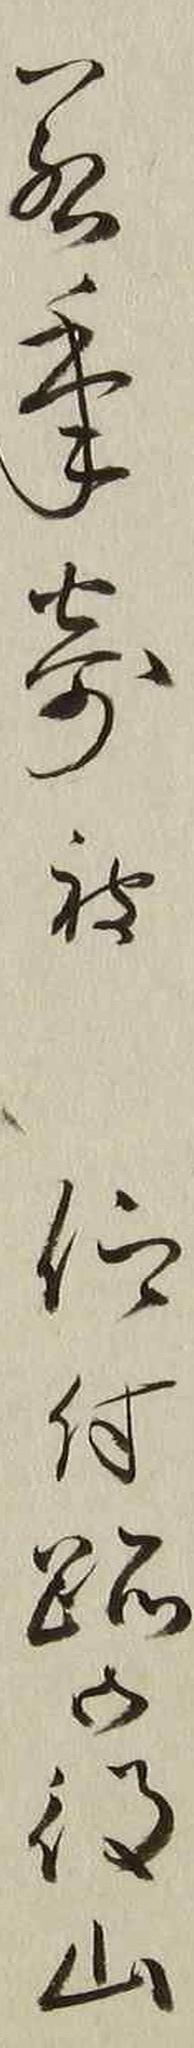若年寄被仰付跡御役山
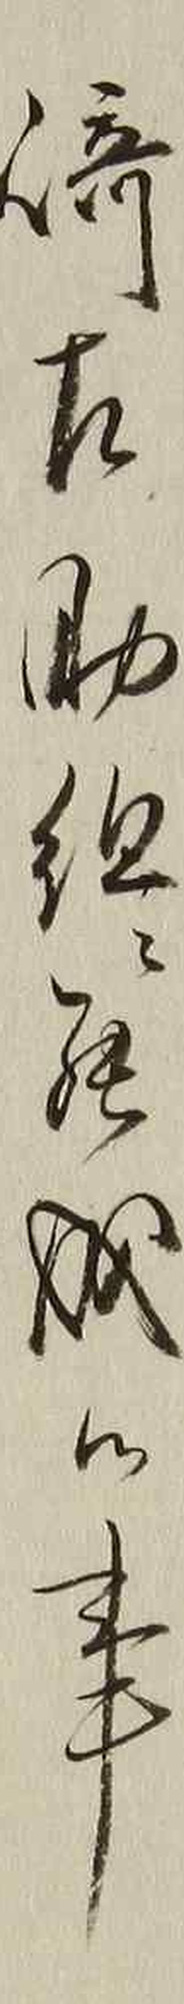崎左助組ニ罷成候事
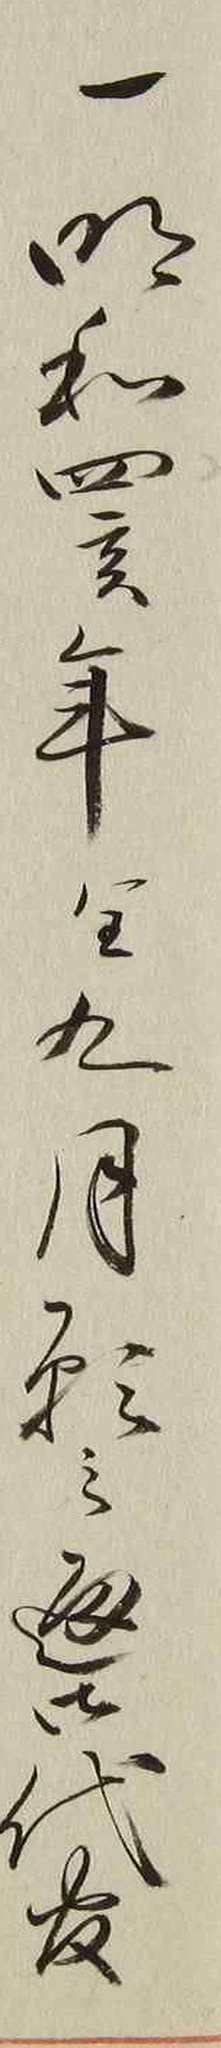一明和四亥年閏九月願之通御代官
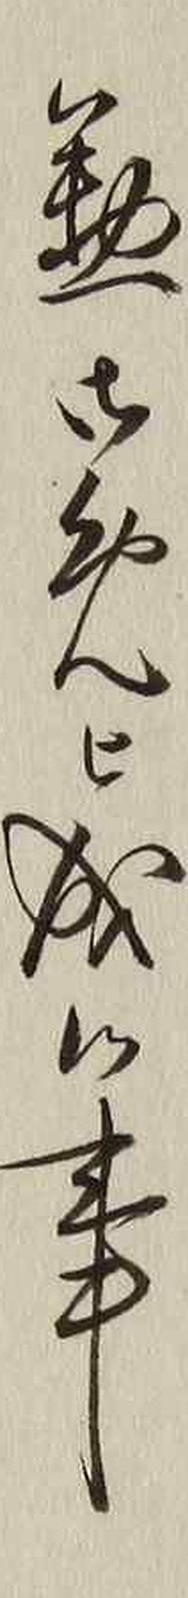勤御免被成候事
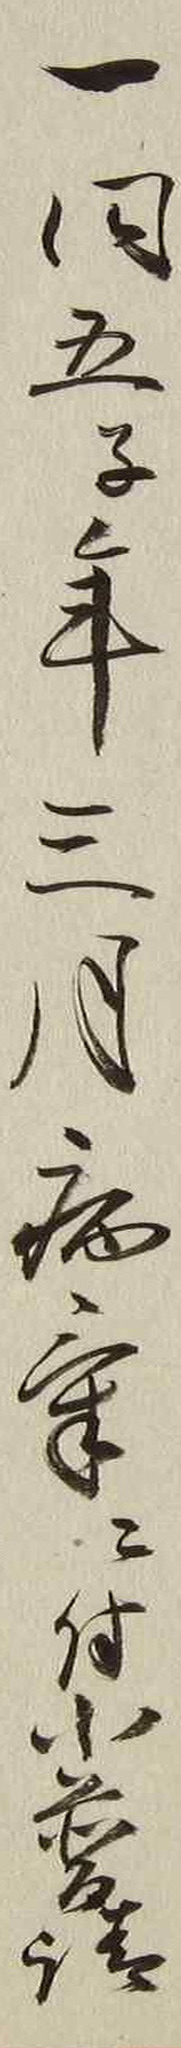一同五子年三月病気ニ付小普請
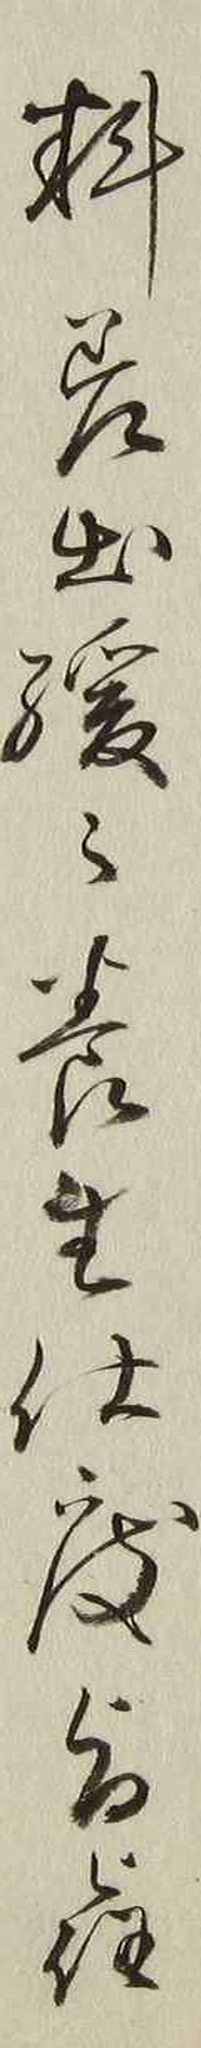料差出緩々養生仕度旨被任
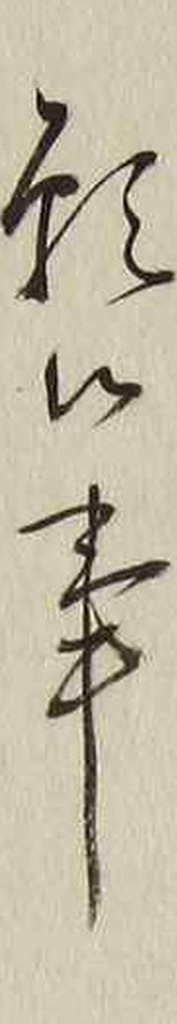願候事
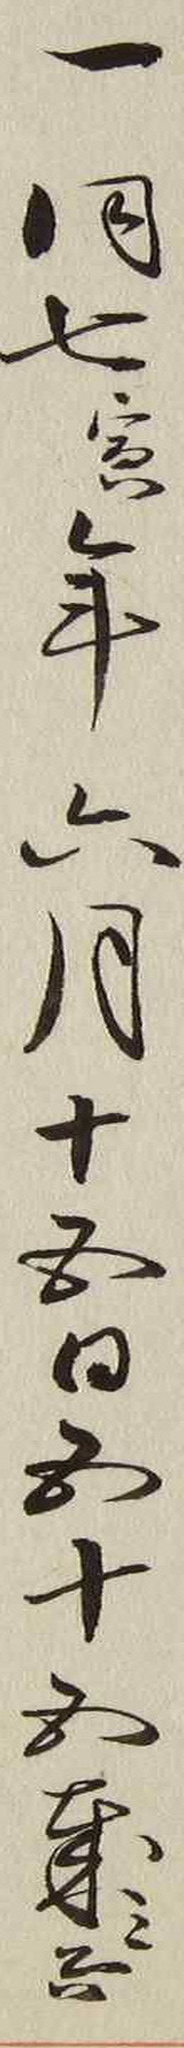一同七寅年六月十五日五十五歳二而
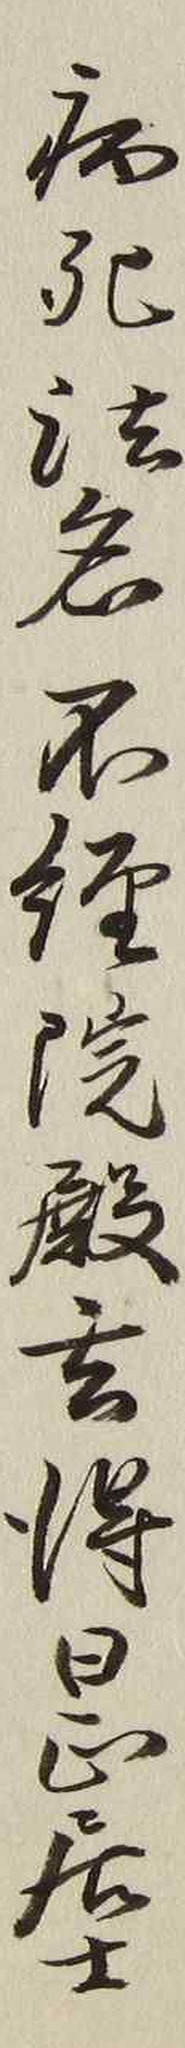病死法名不経院殿玄得日正居士
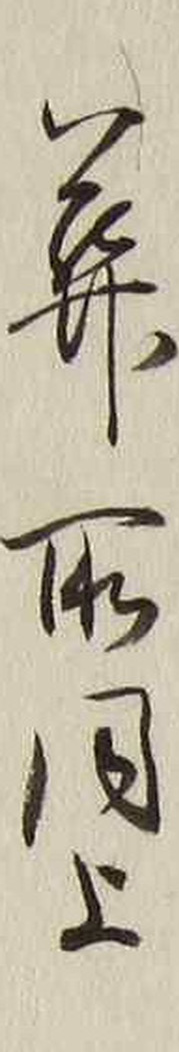葬所同上
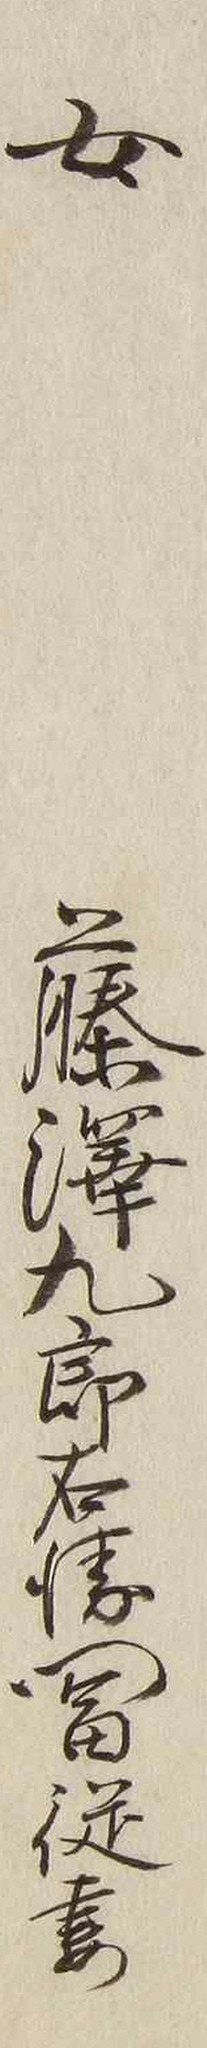女藤沢九郎右衛門富従妻
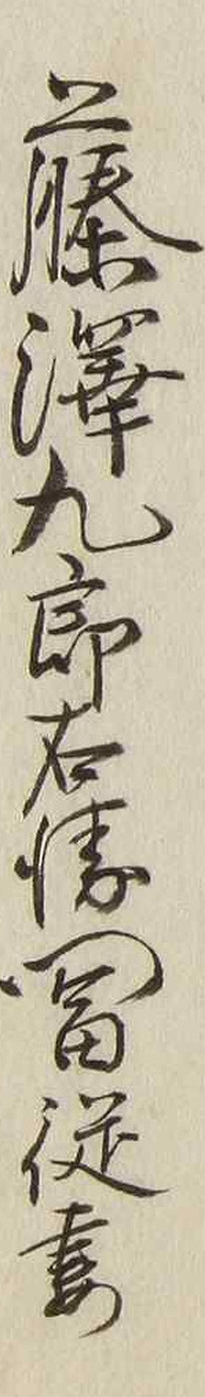女藤沢九郎右衛門富従妻

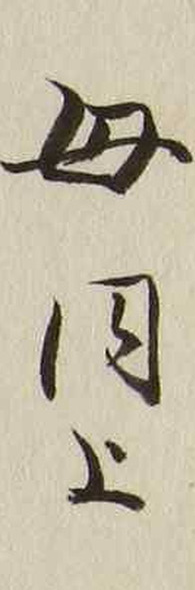母同上
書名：諸士系譜　巻之163　な之部5
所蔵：会津若松市立会津図書館
